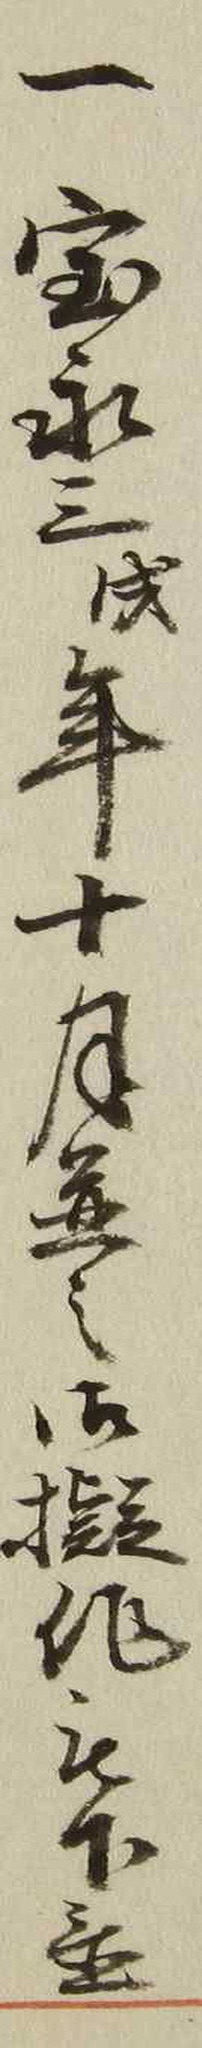一宝永三戌年十月並之御擬作被下置
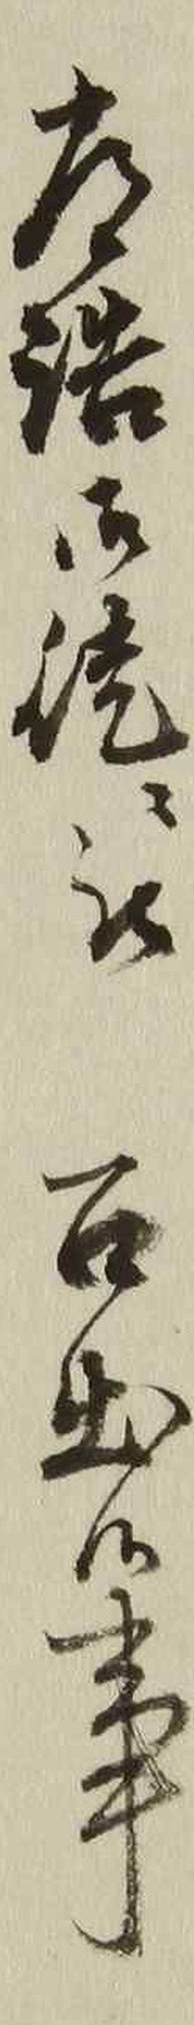常詰御徒ニ被召出候事
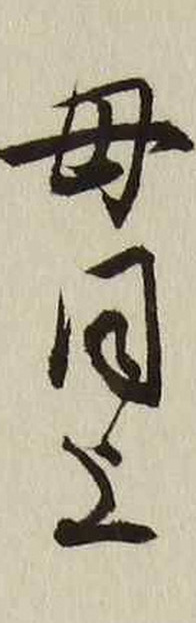母同上
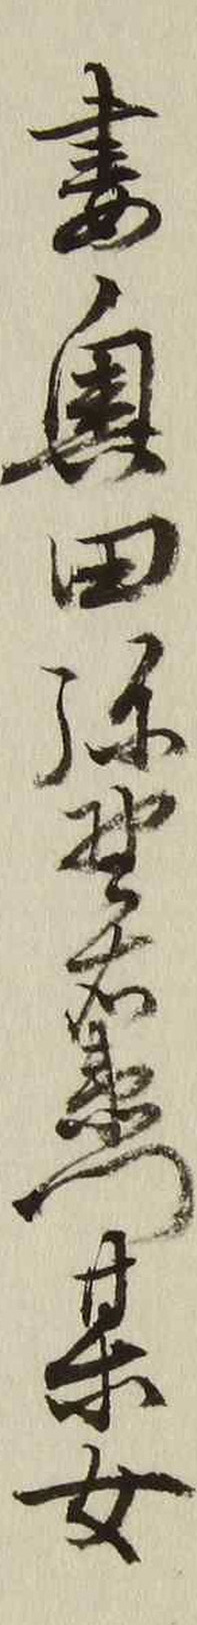妻奥田弥野右衛門某女
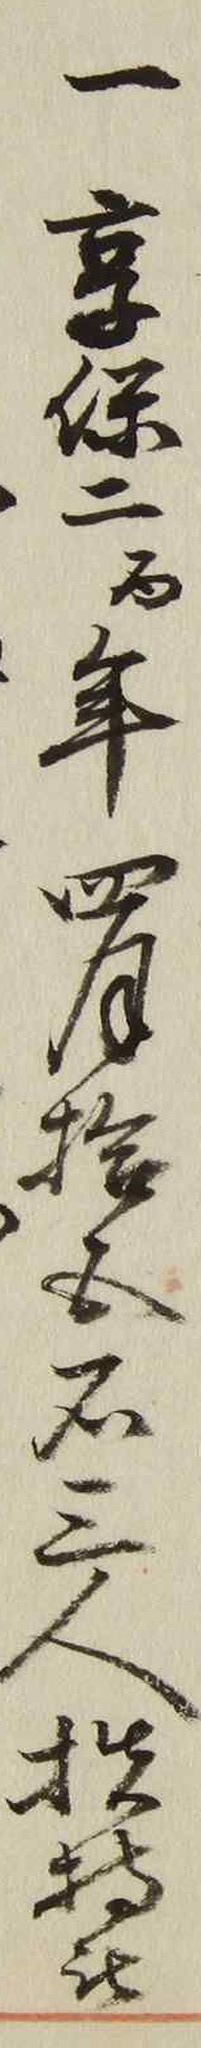一享保二酉年ニ四月拾五石三人扶持被
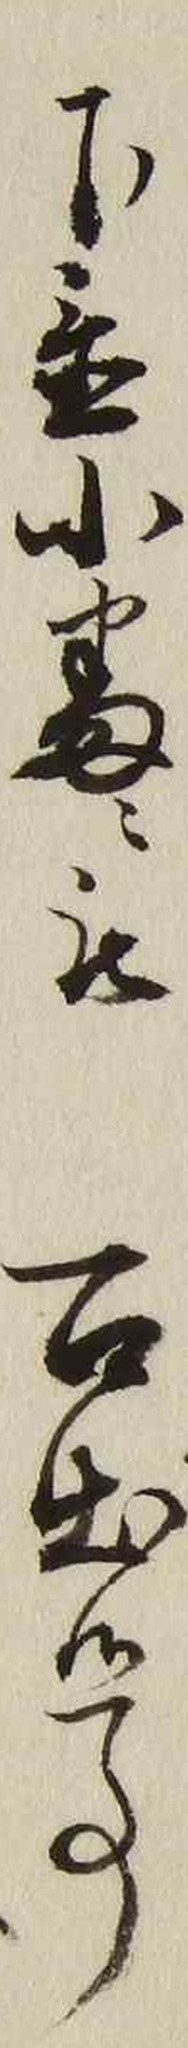下置小番ニ被召出候事
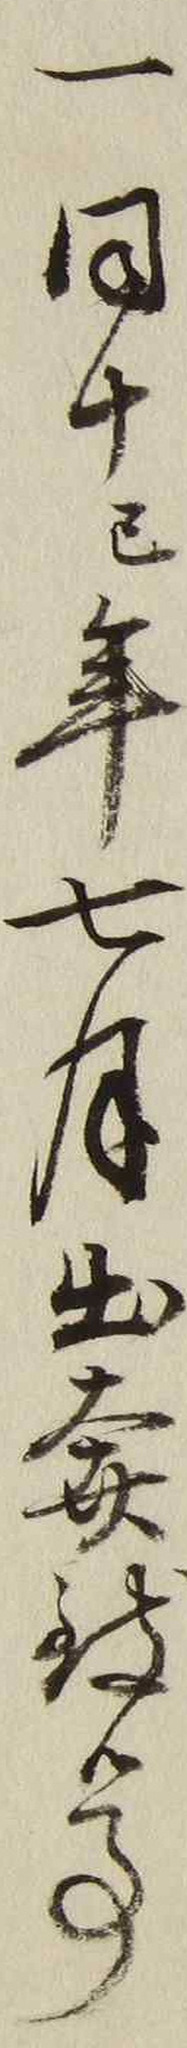一同十巳年七月出奔致候事

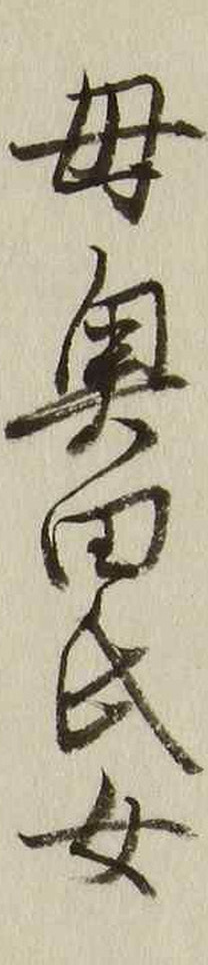母奥田氏女
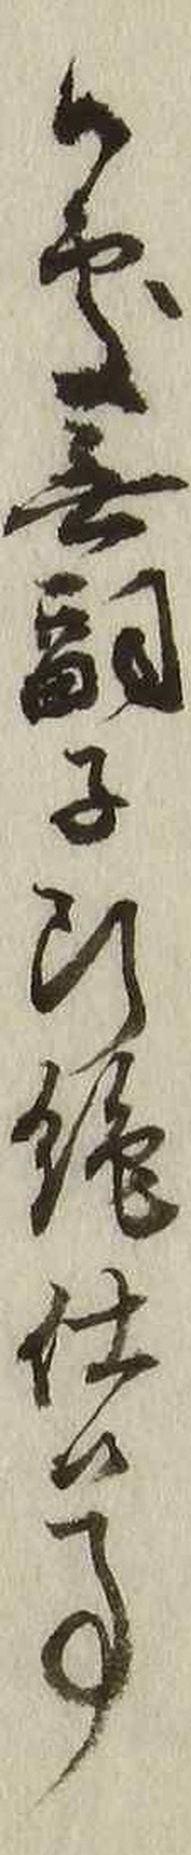候処無嗣子断絶仕候事
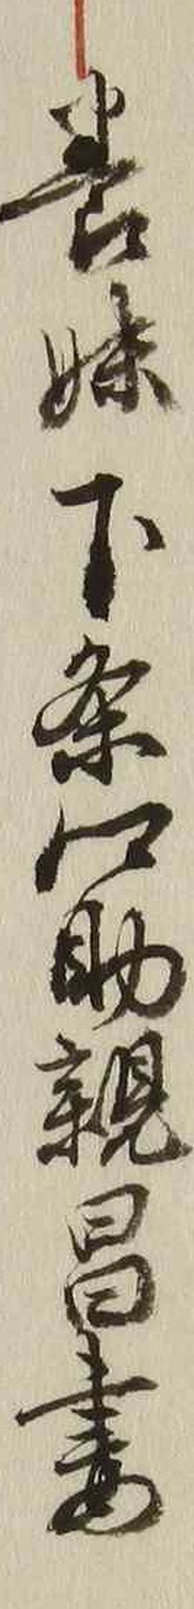養妹下条郷助親昌妻
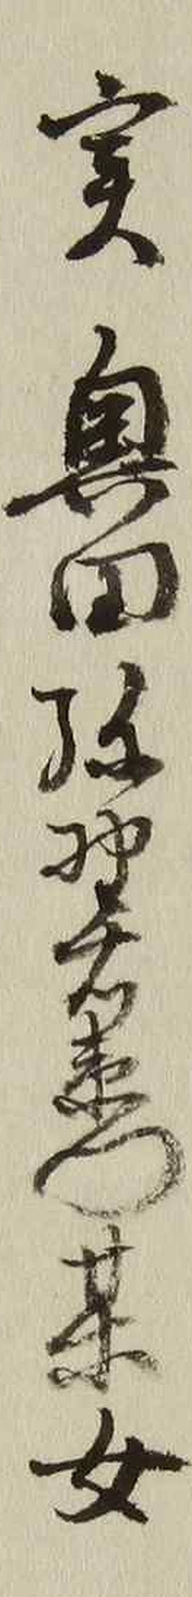実奥田弥野右衛門某女
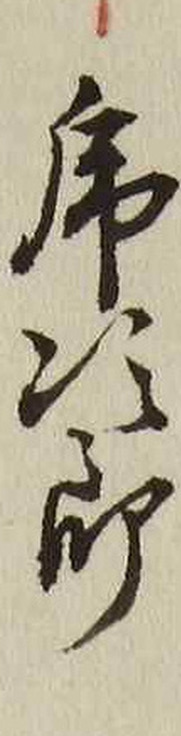乕次郎
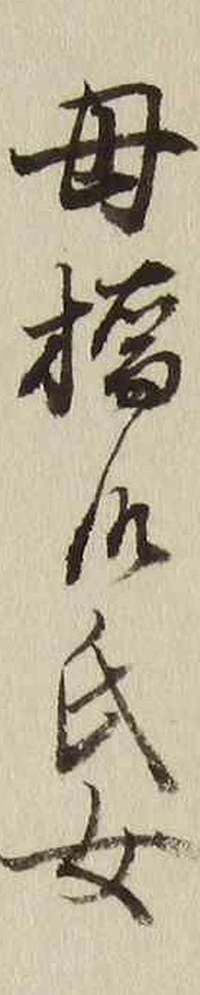母橋爪氏女
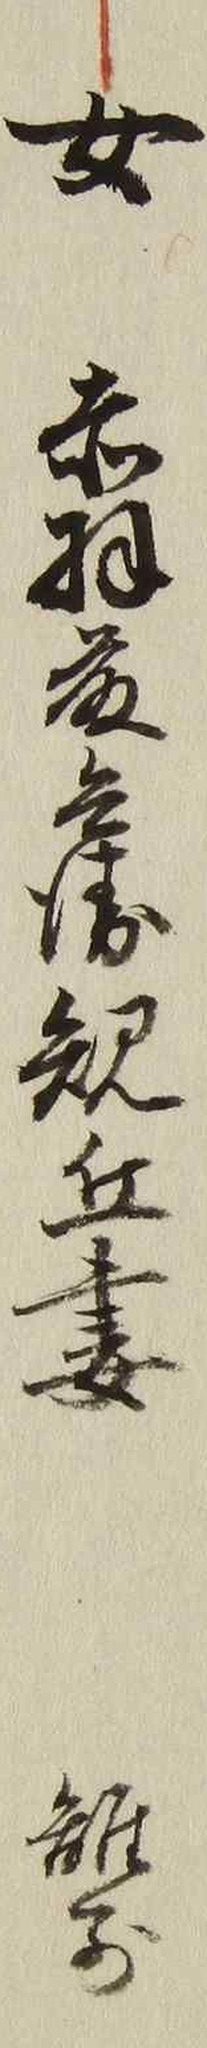女赤羽藤兵衛規丘妻離別
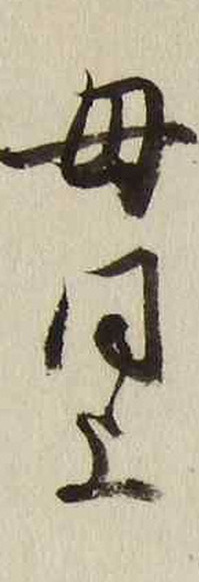母同上

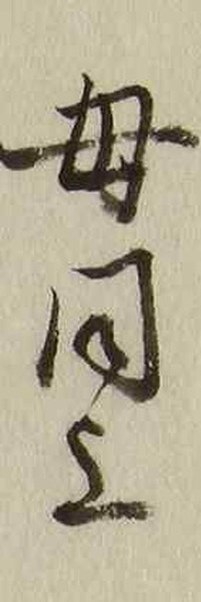母同上
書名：諸士系譜　巻之39　は之部7
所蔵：会津若松市立会津図書館
